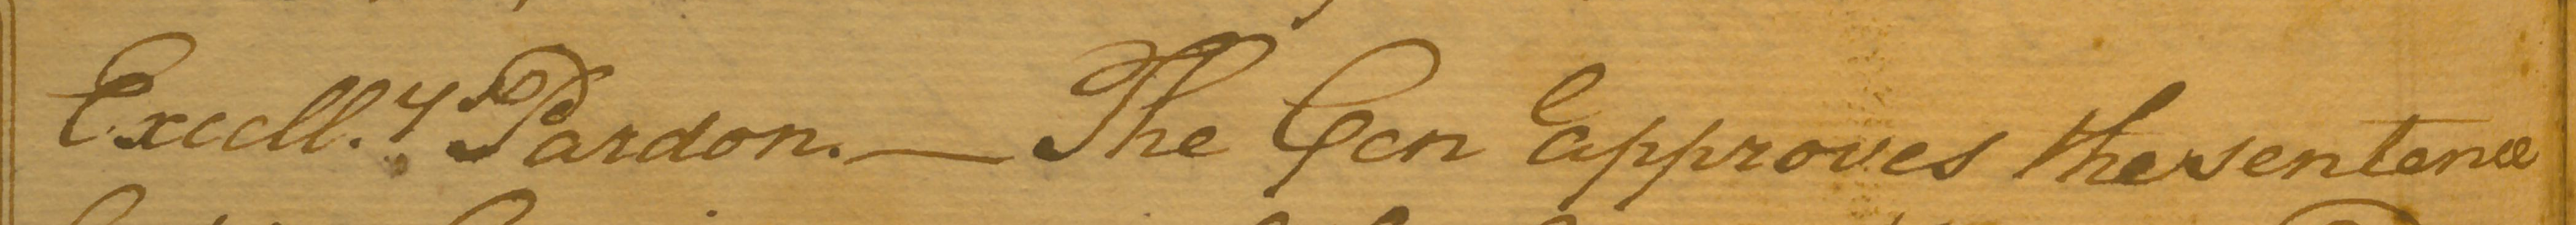Excell^y. Pardon- The Gen^l approves the sentence
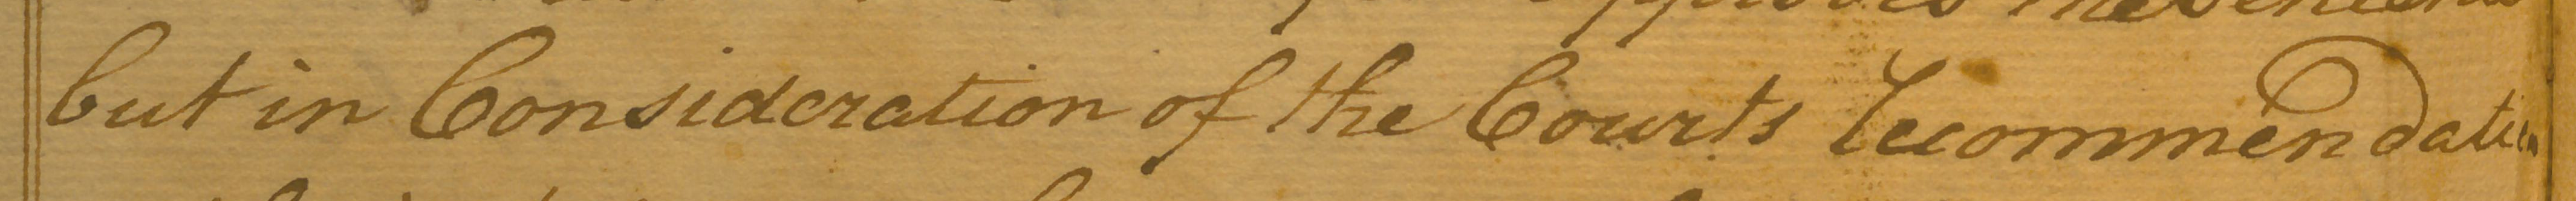but in Consideration of the Courts recommendation
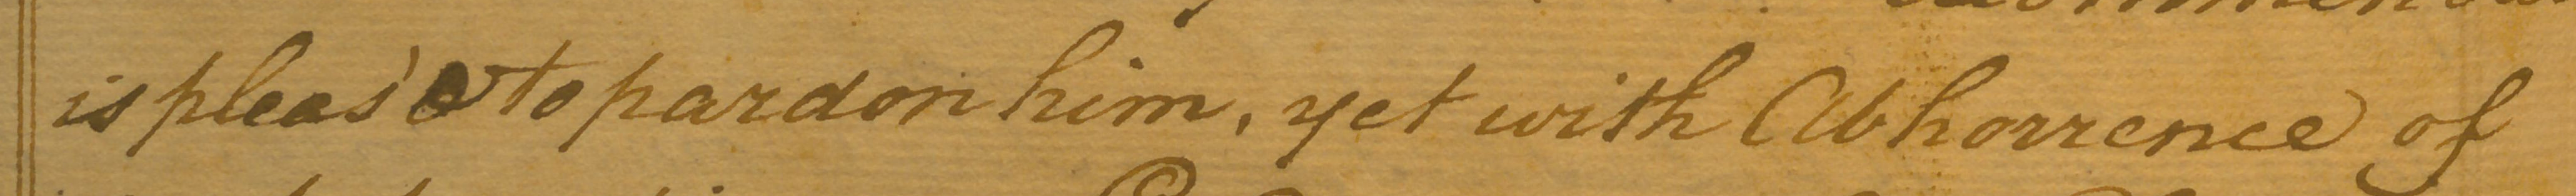is pleas'd to pardon him, yet with Abhorrence of
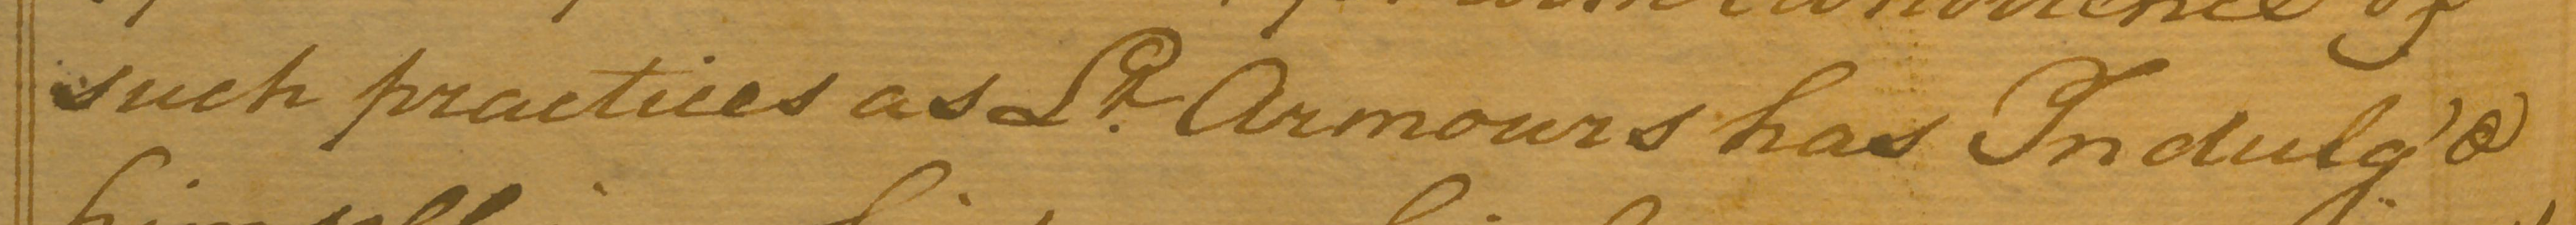such practices as L^t. Armours has Indulg'd
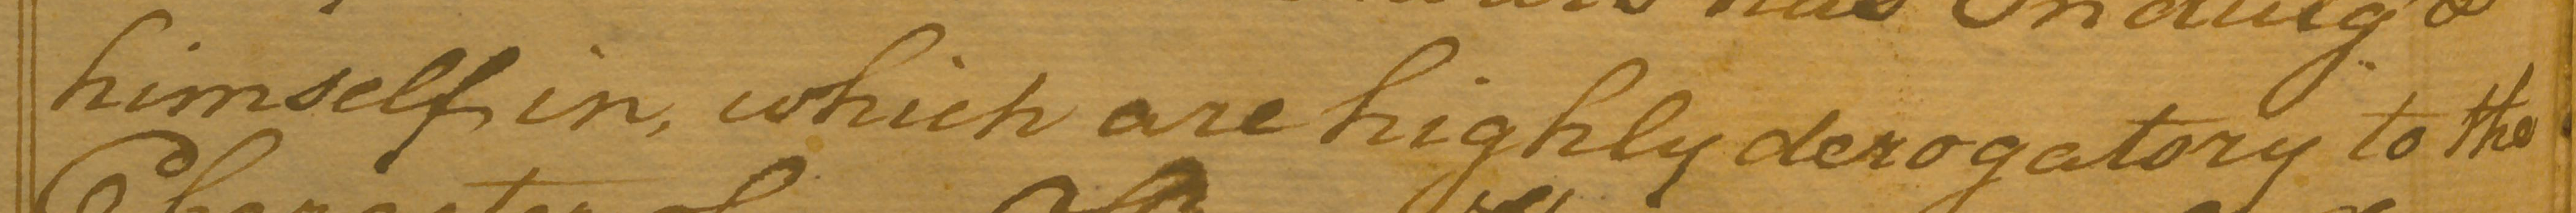himself in, which are highly derogatory to the
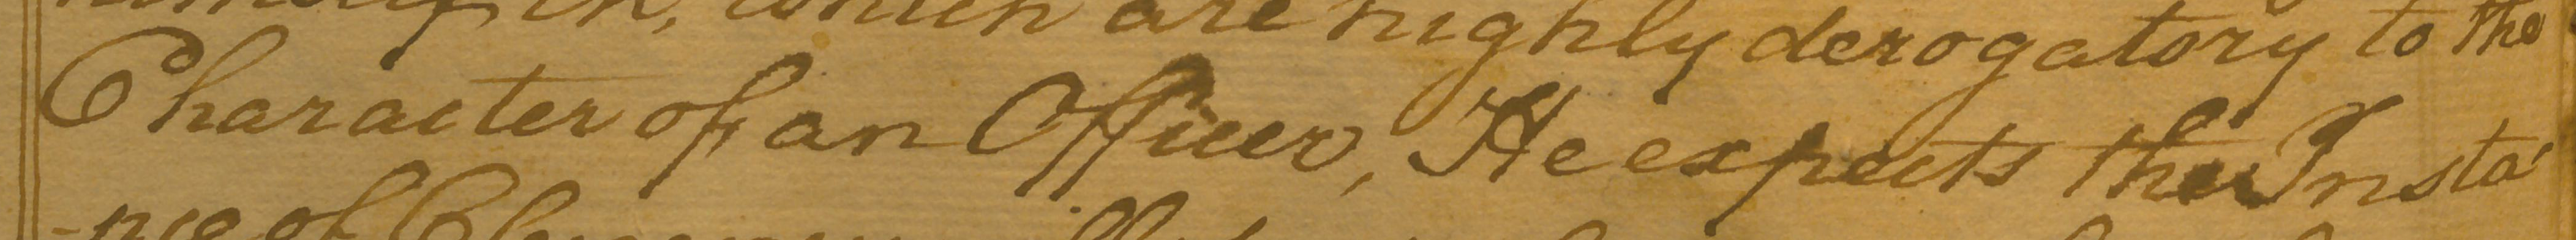Character of an Officer, He expects the Insta-
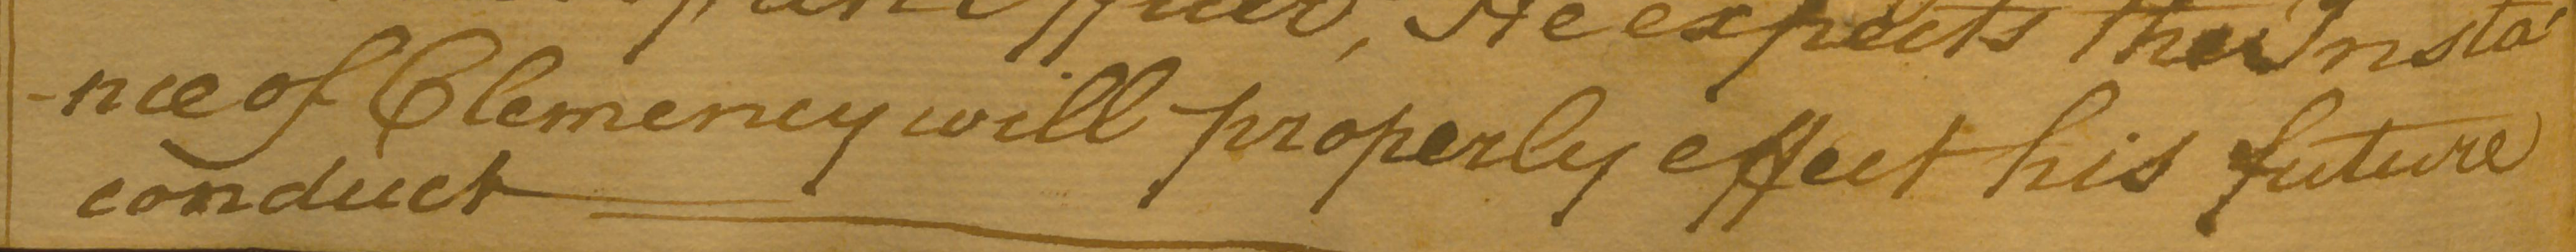-nce of Clemency will properly effect his future
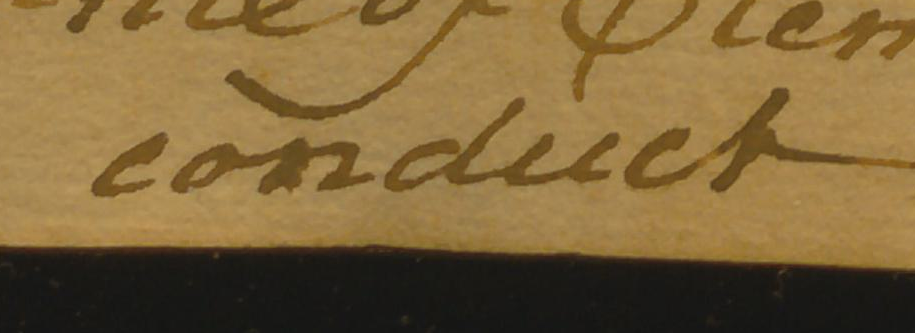conduct-
